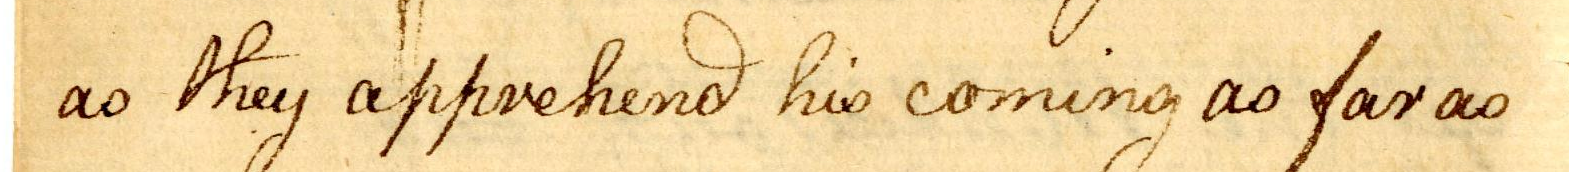as they apprehend his coming as far as
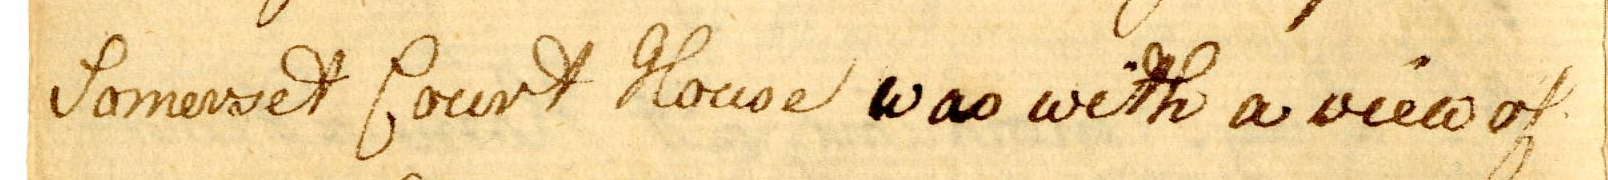Somerset Court House was with a view of
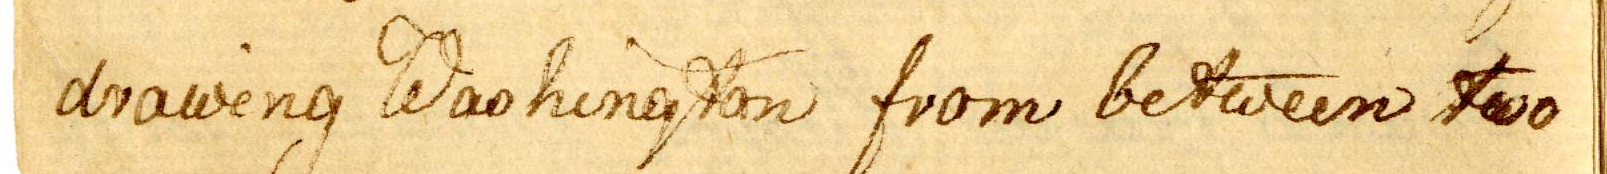drawing Washington from between two
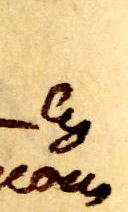ly
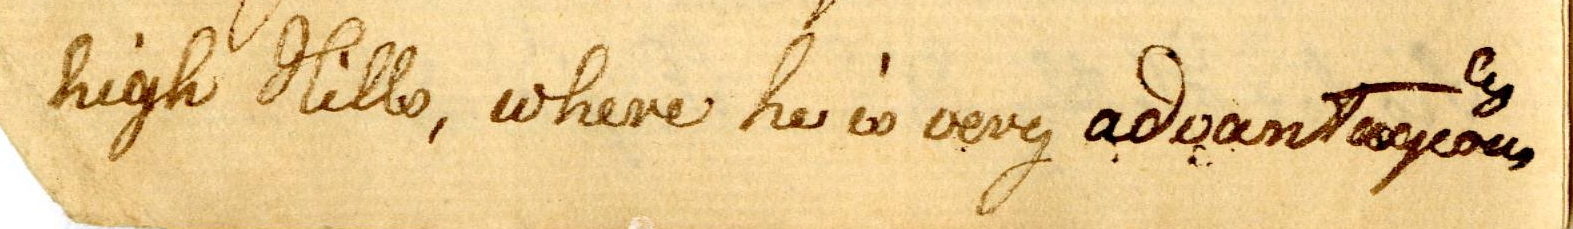high Hills, where he is very advantageous
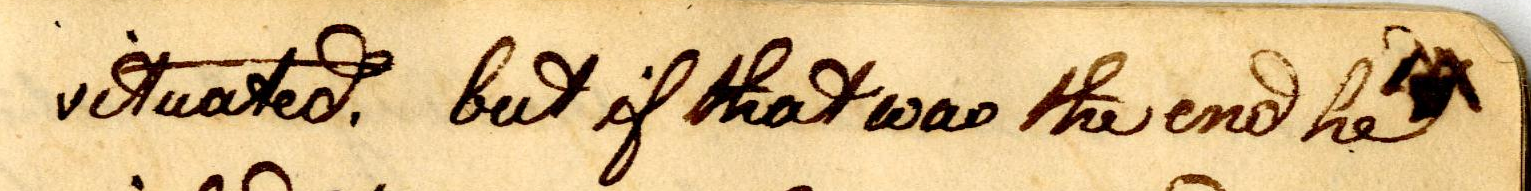situated. but if that was the end he
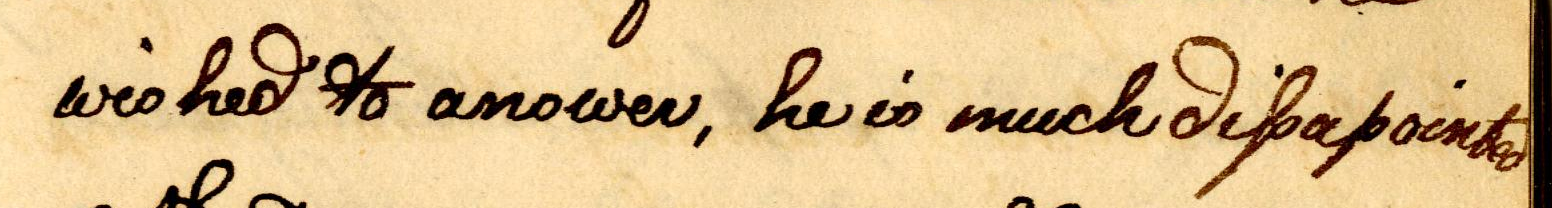wished to answer, he is much dissapointed
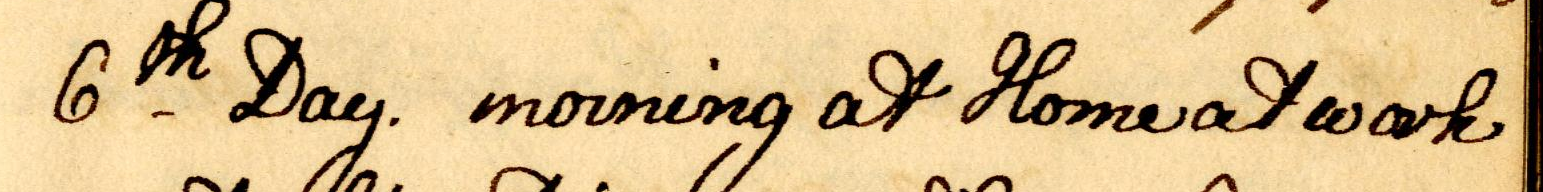6^th Day. morning at Home at work
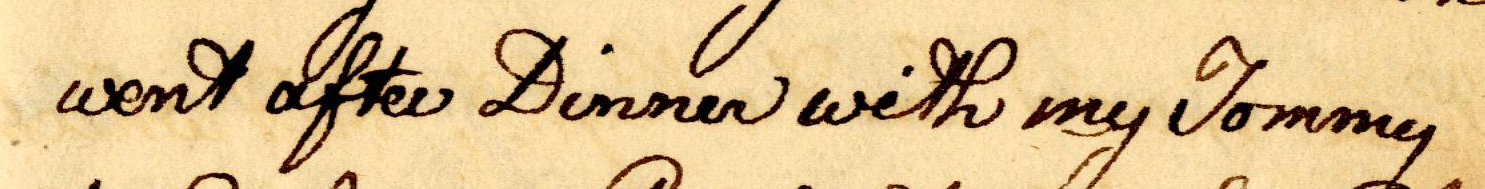went after Dinner with my Tommy
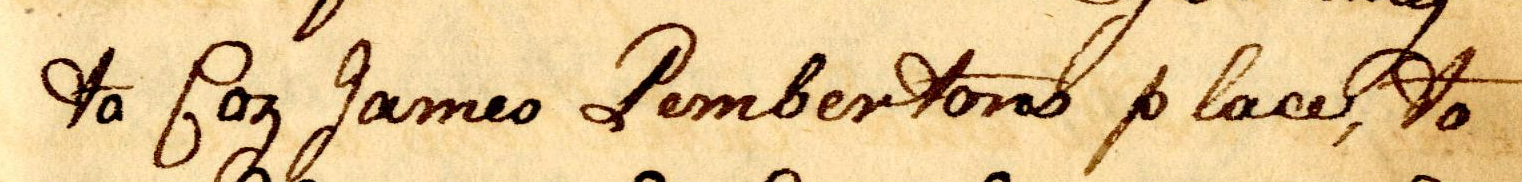to Coz James Pembertons place, to
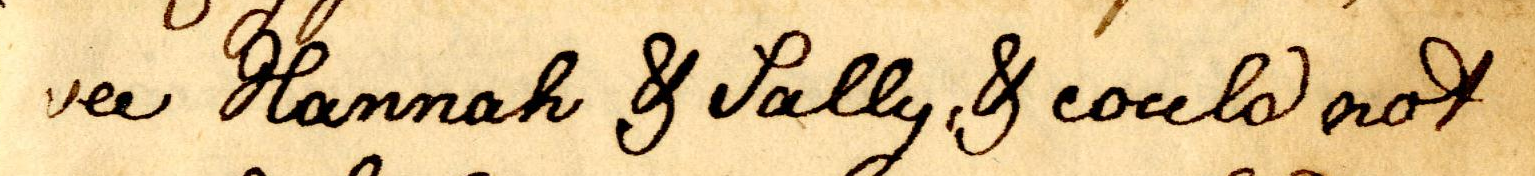see Hannah & Sally, & could not
